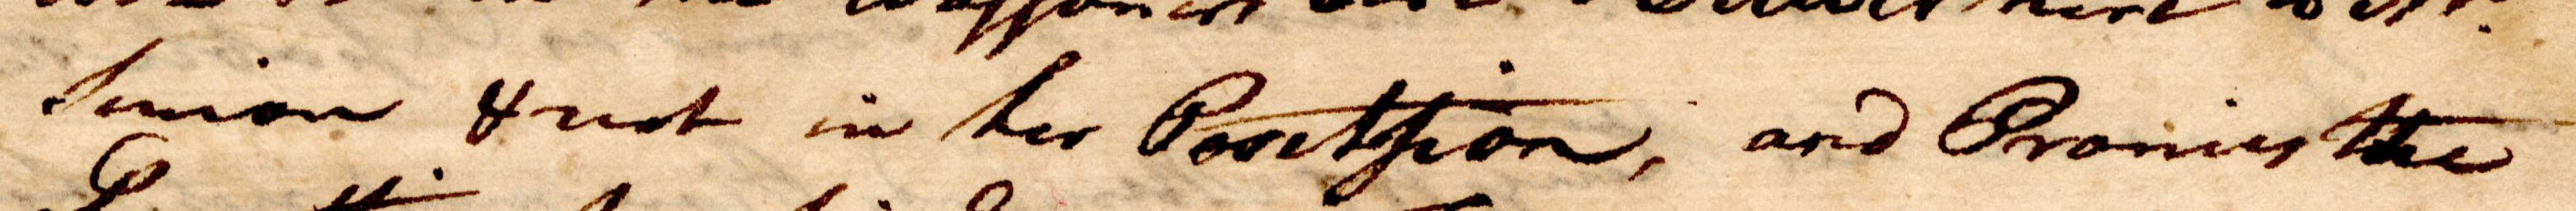Simon & not in her Position, and Promises take
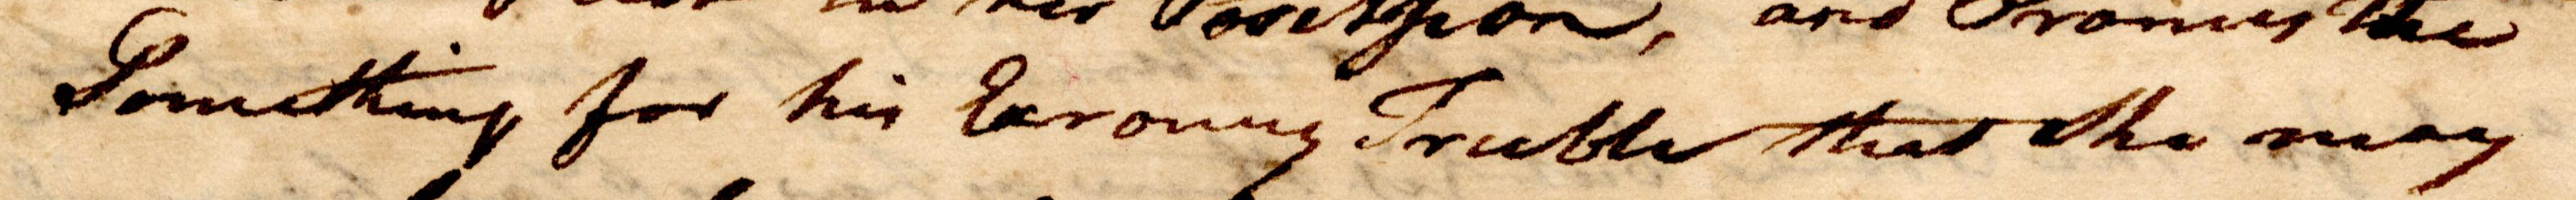Something for his Exroing Truble that she may
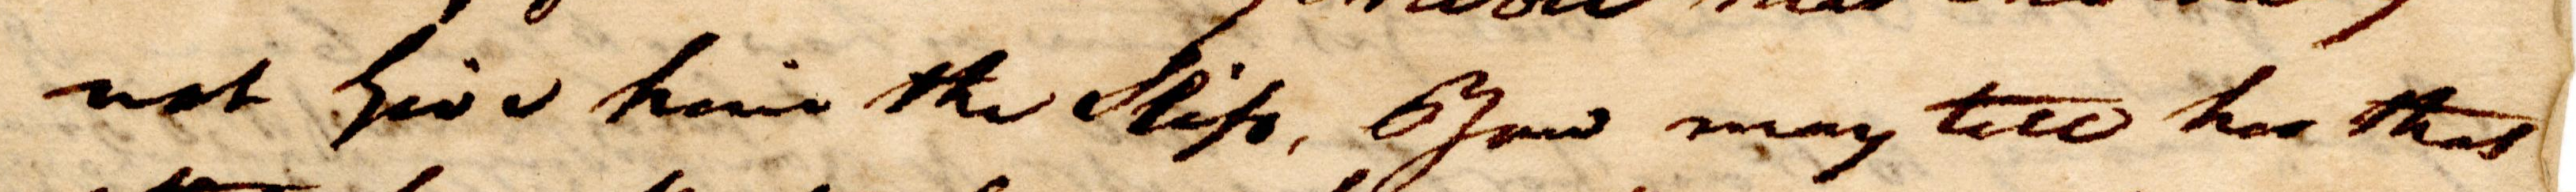not give him the Slip, you may tell her that
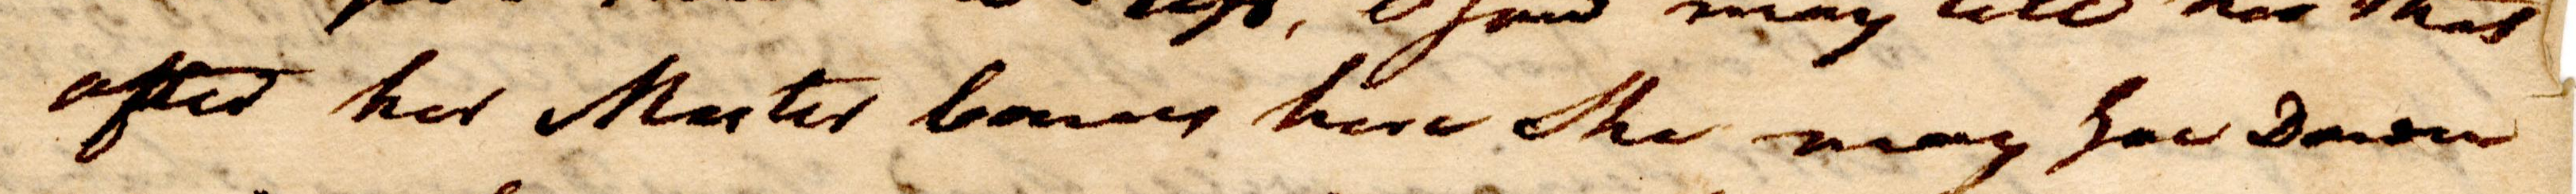after her Master comes here she may Goe down
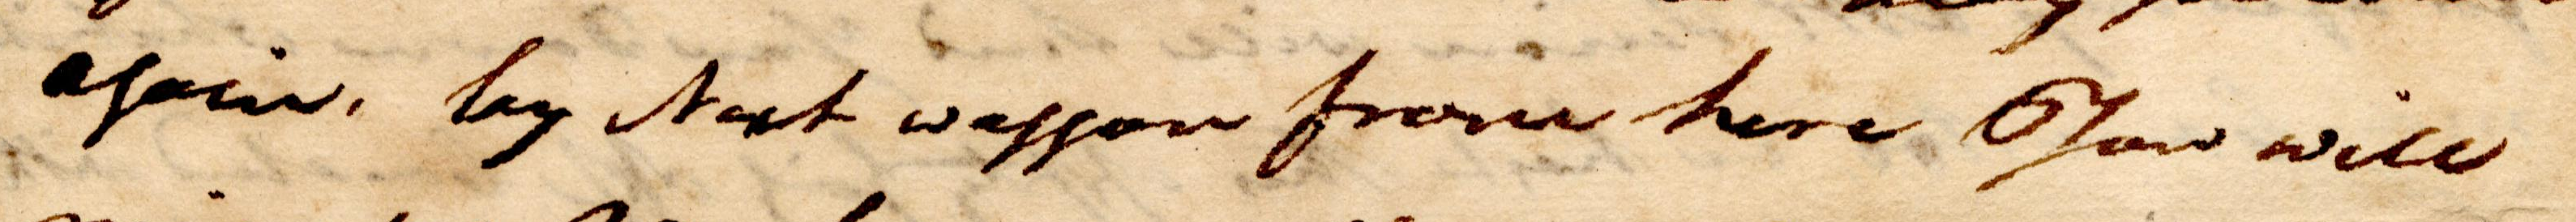again, by Next waggon from here you will
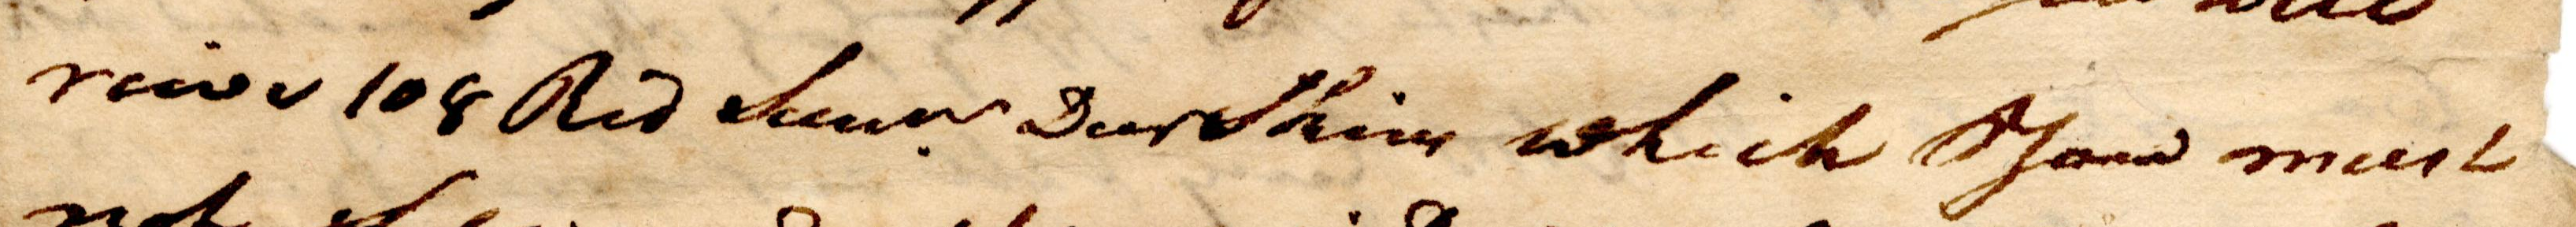receive 108 Red Sum^r. Deer Skins which you must
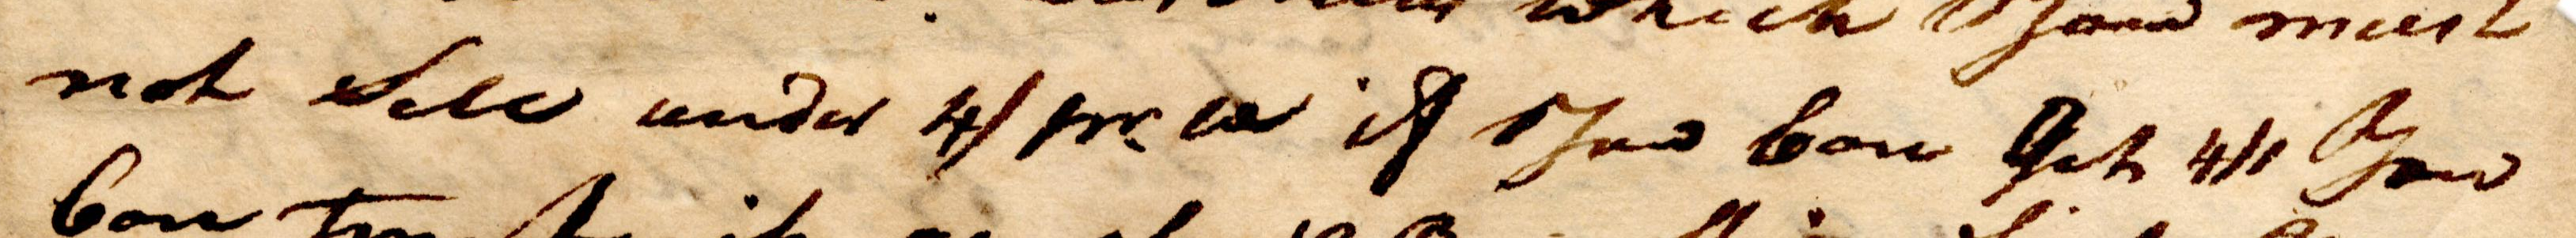not sell under 4s per or if you can get 4s1 you
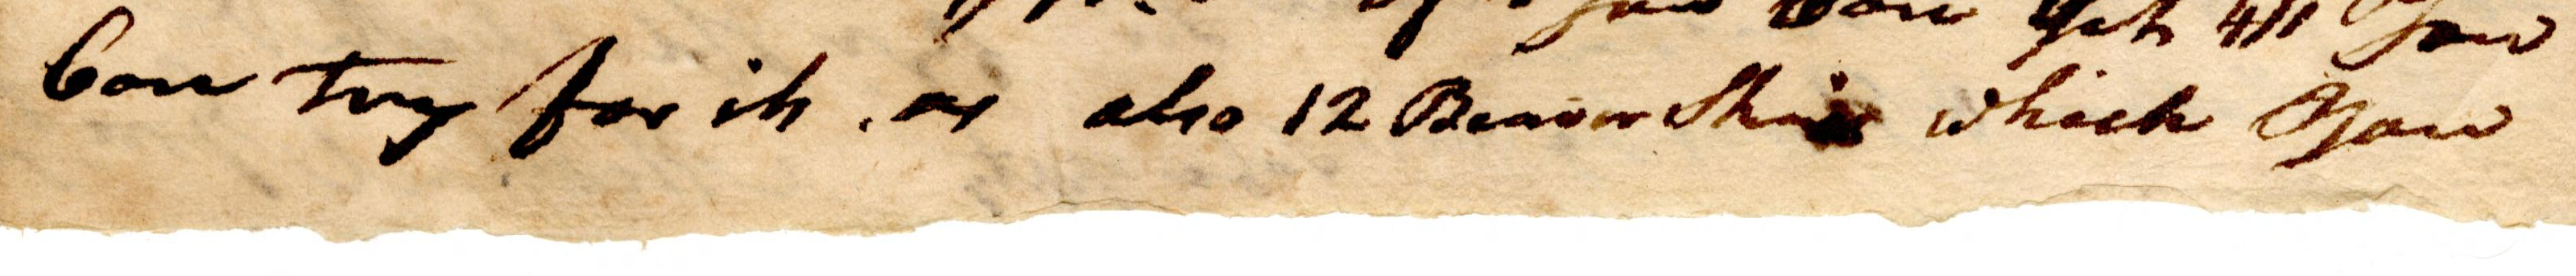Can try for it as also 12 Beaver skins which you
